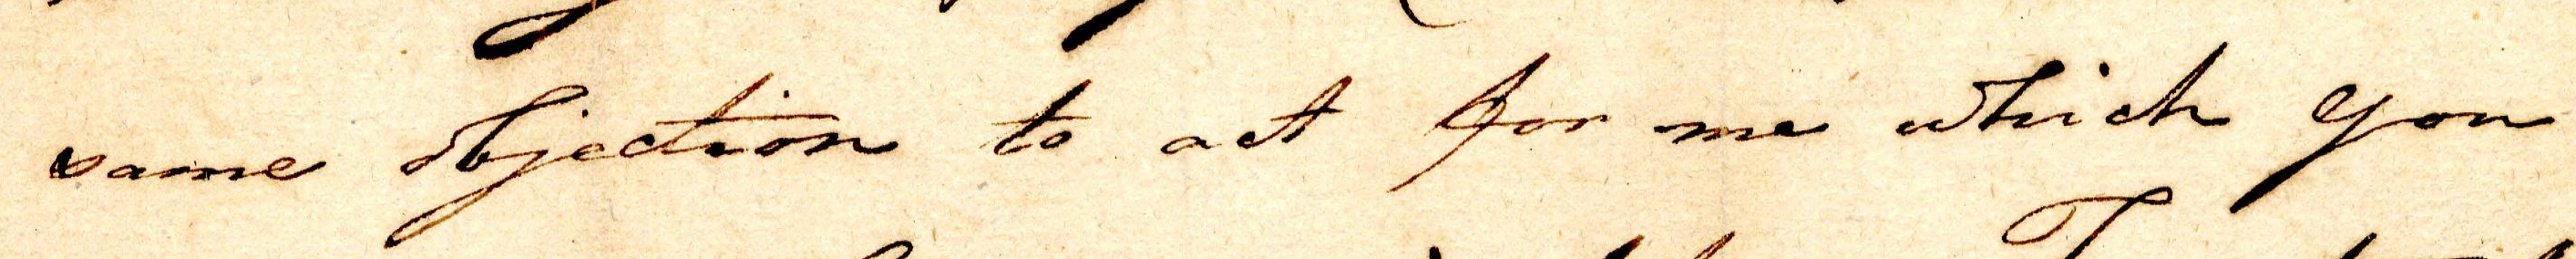same objection to act for me which you
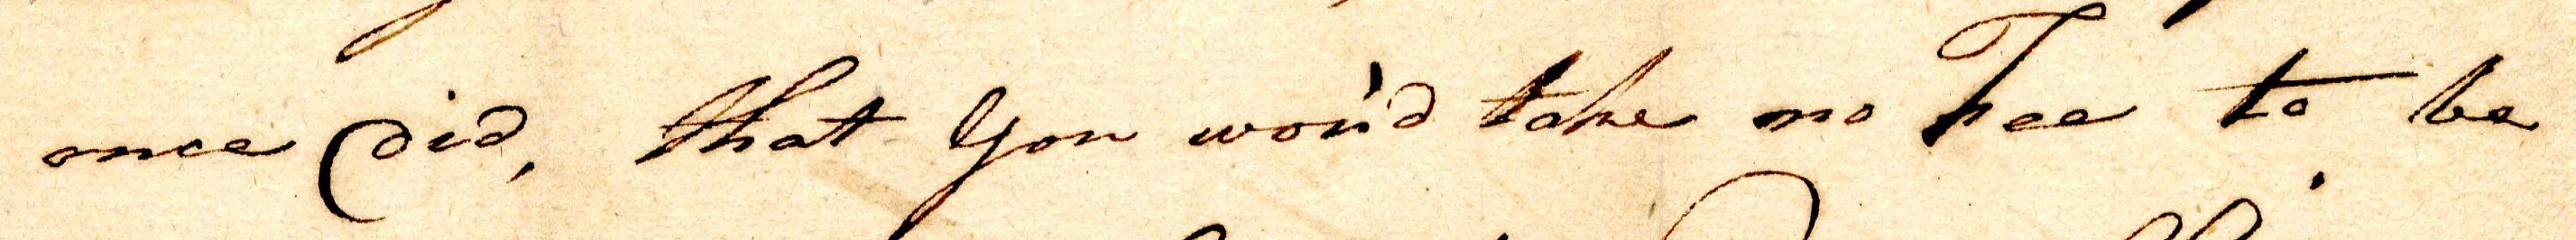once did, that You wou'd take no Fee to be
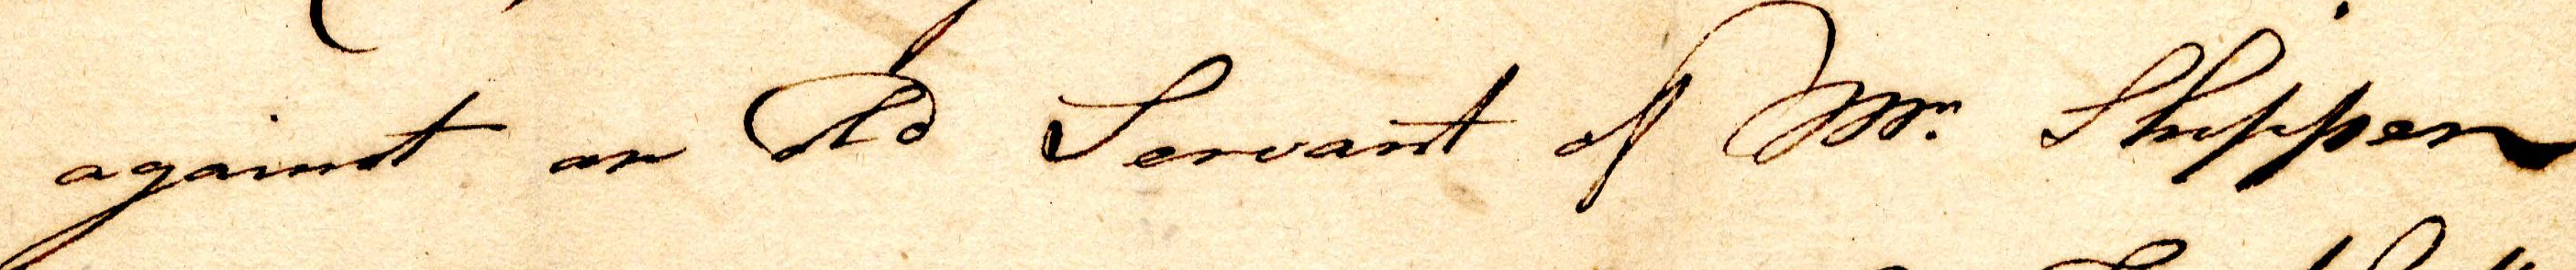against an old Servant of M^r. Shippen
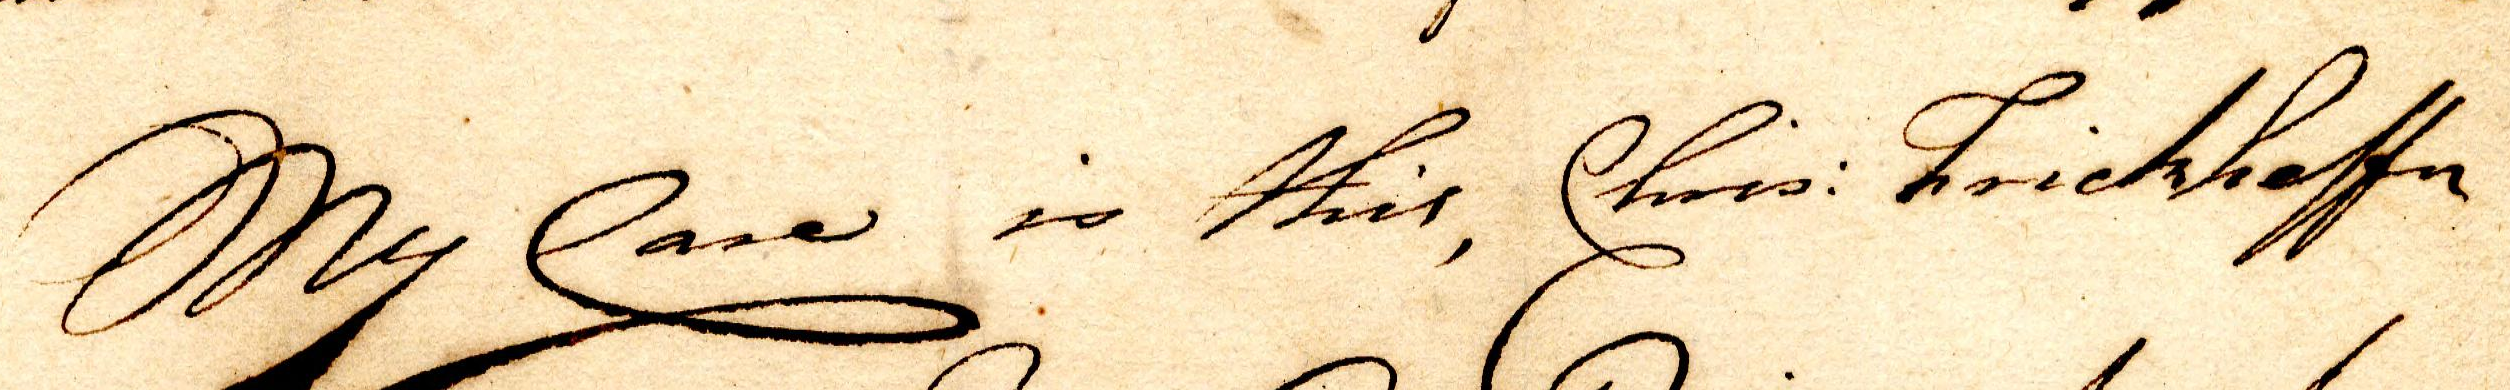My Case is this, Chris: Frickheffer
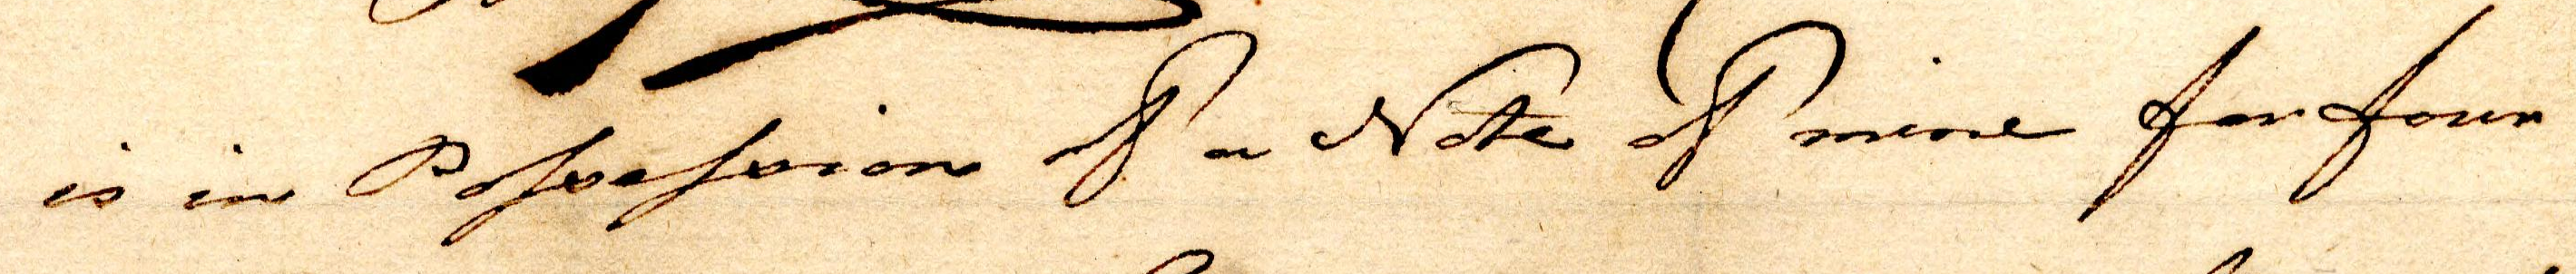is in Possession of a Note of mine for four
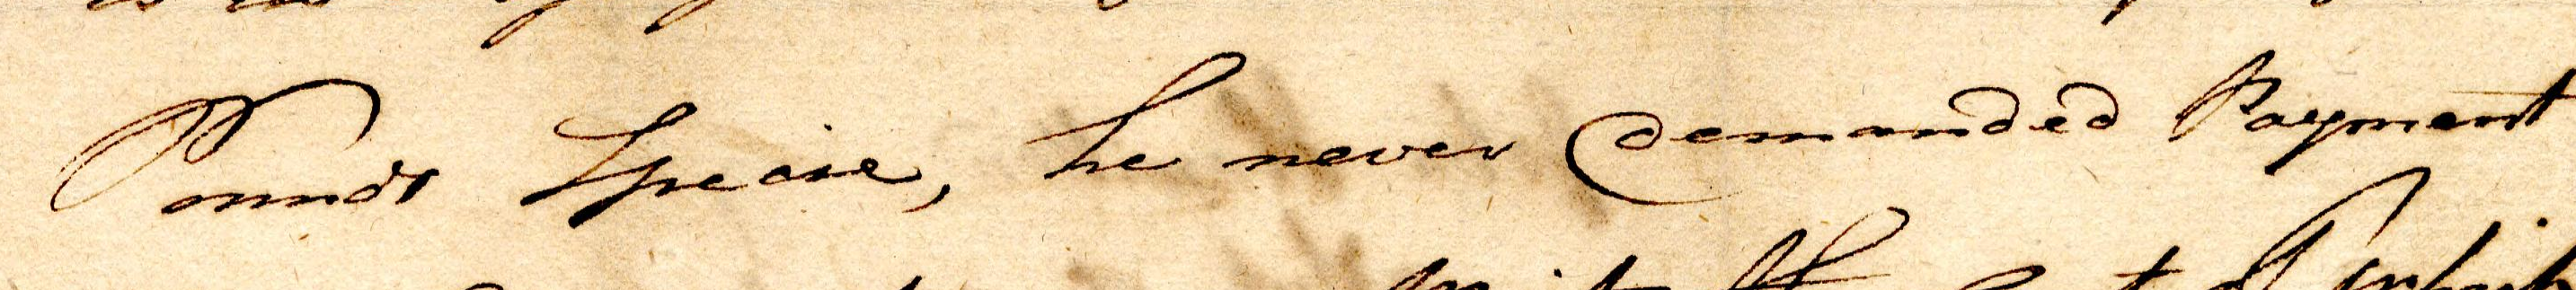Connor Spease, he never comanded Payment
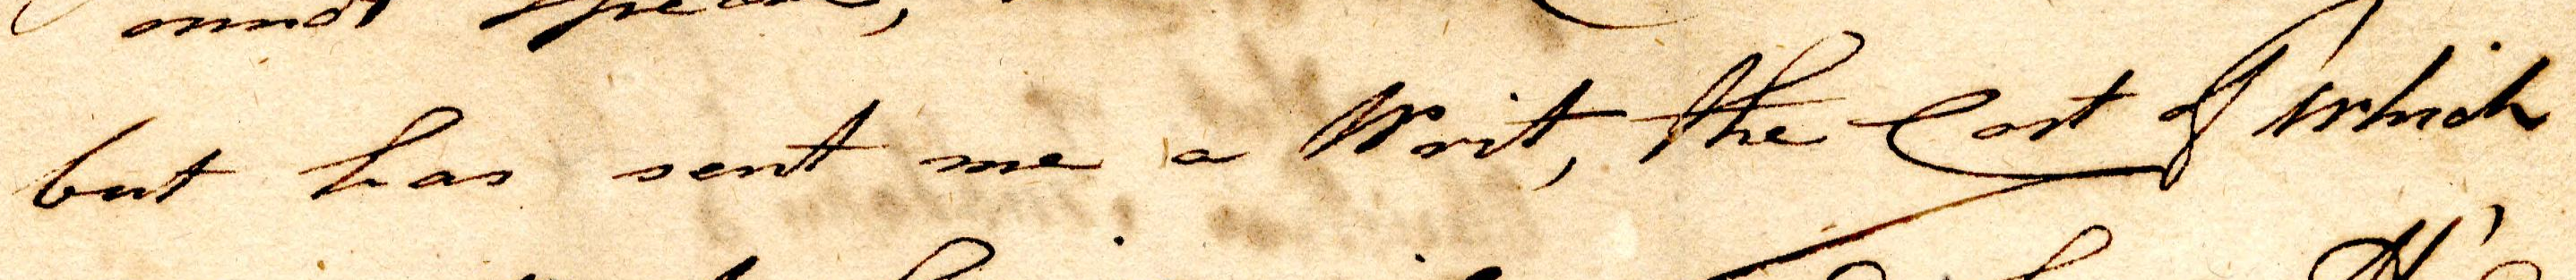but has sent me a Writ, the Cost of which
